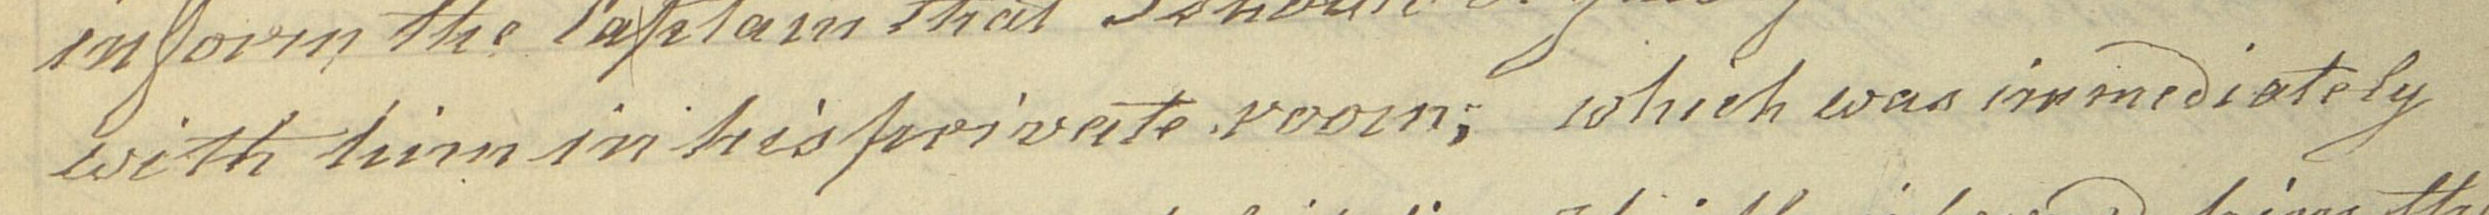with him in his private room; which was immediately
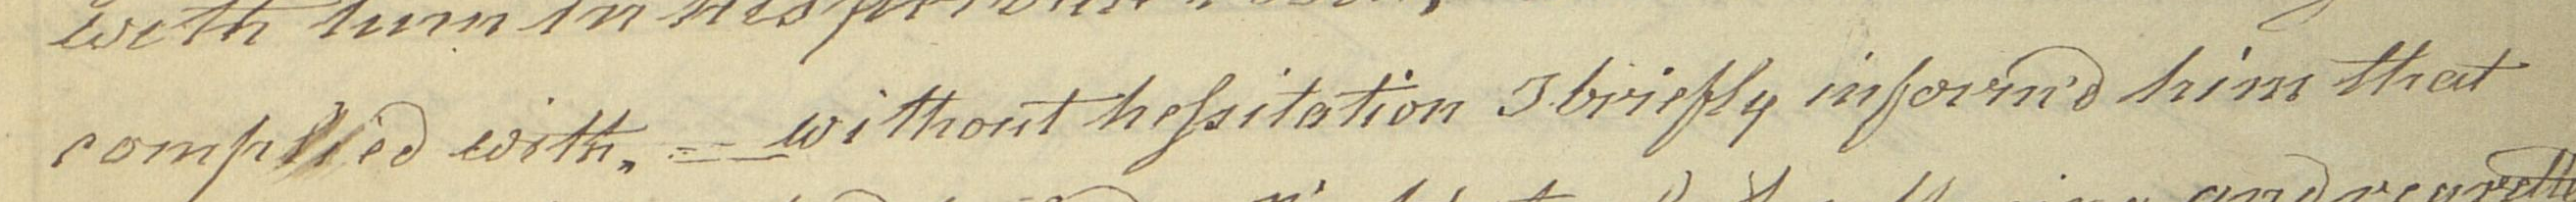complied with. without hesitation I briefly inform'd him that
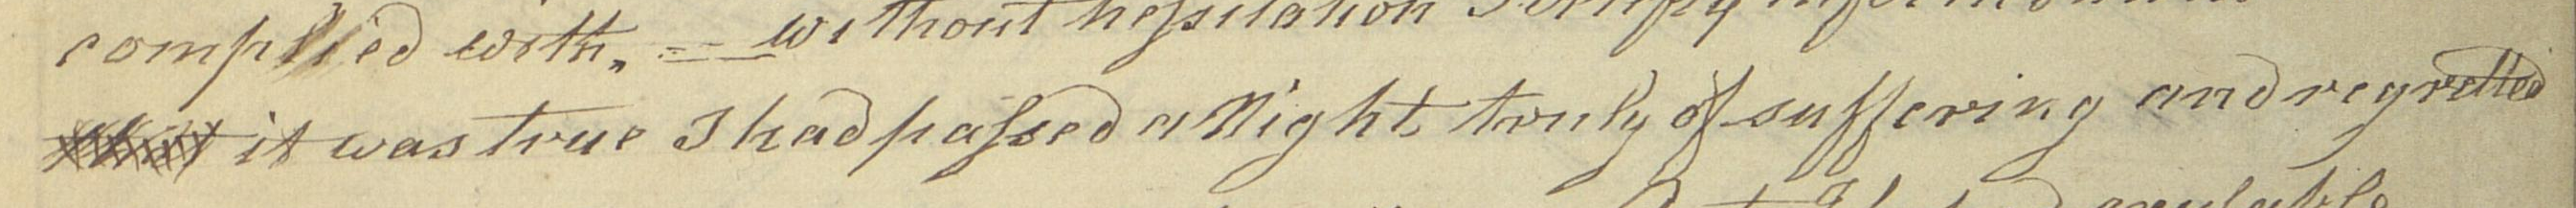that it was true I had passed at Night truly of suffering and regretted
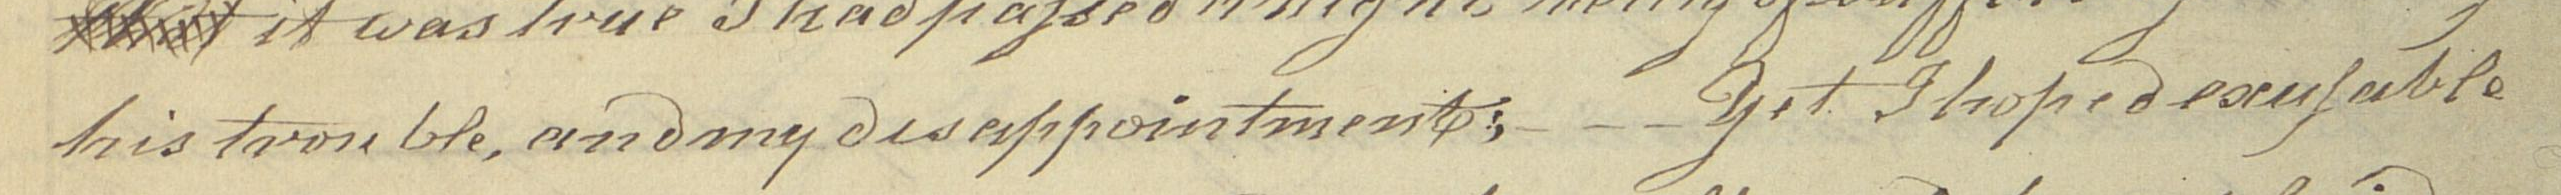his trouble, and my disappointment; Yet I hoped exusable
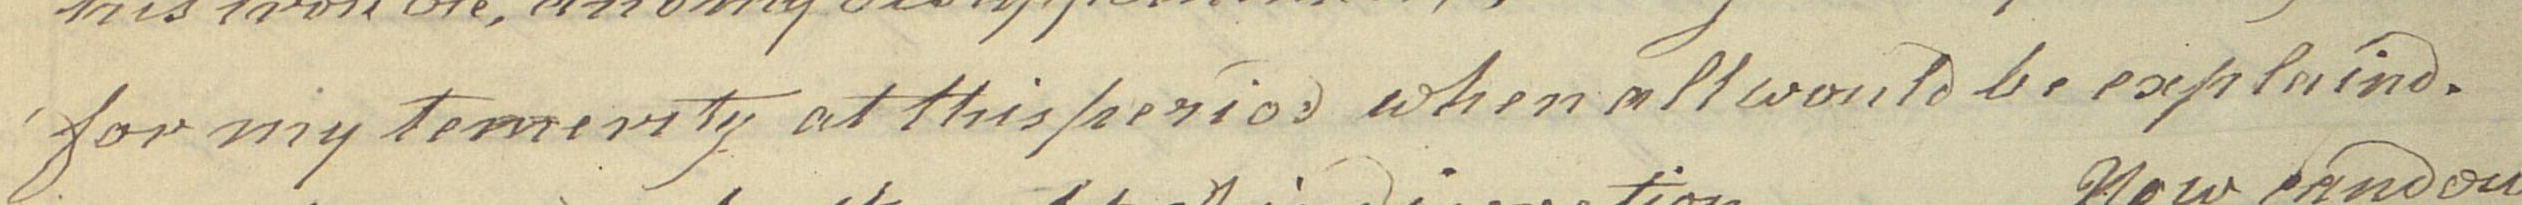for my temerity at this period when all would be explaind
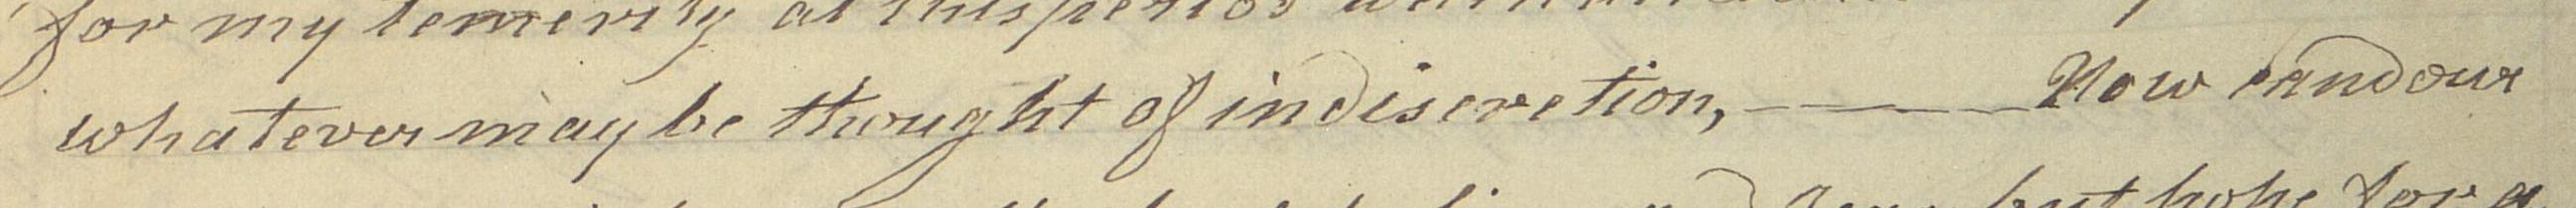whatever may be thought of indiscretion, Now candour
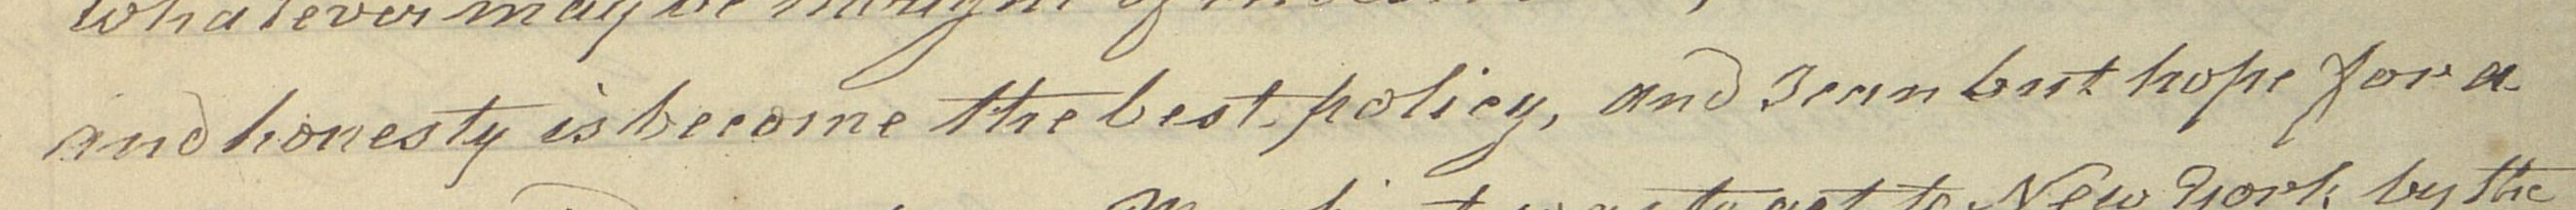and honesty is become the best policy, and I can best hope for a
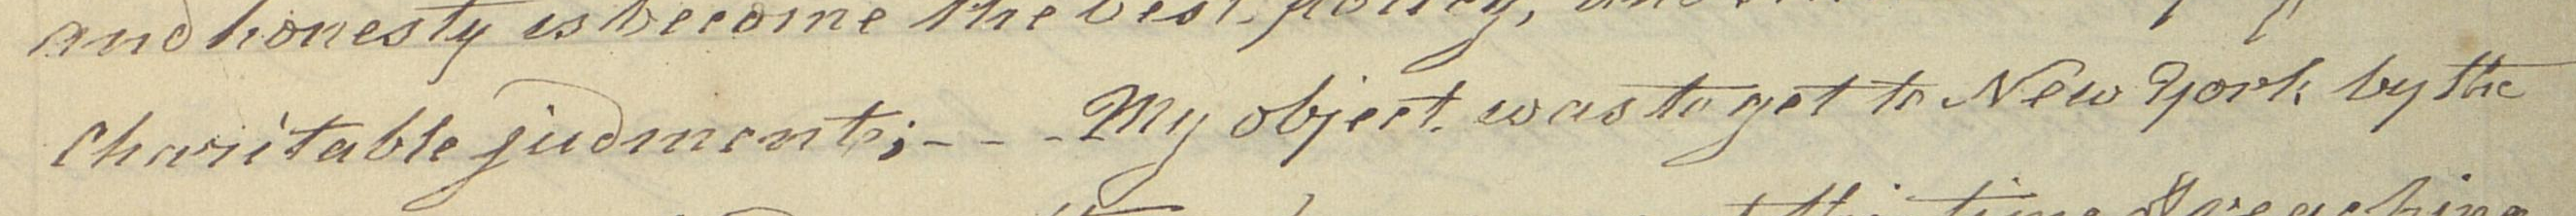charitable judment; My object was to get to New York by the
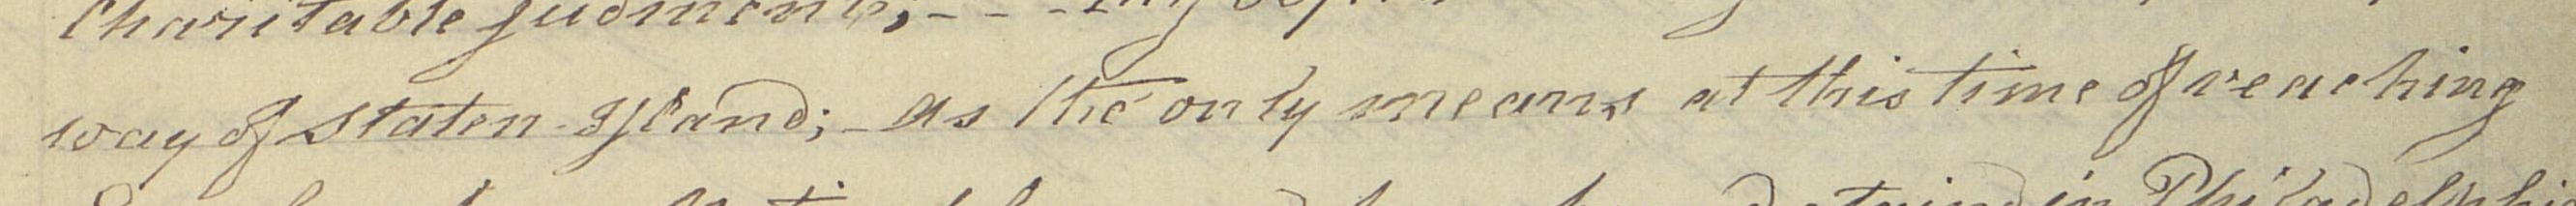way of Staten Island; as the only means at this time of reaching
